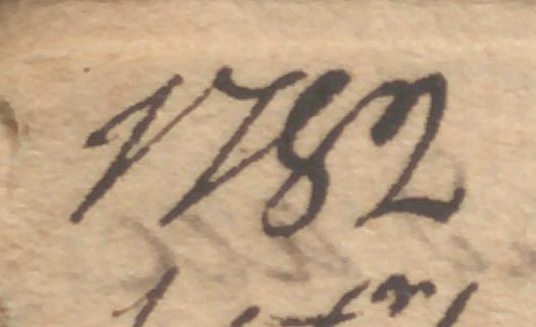1782
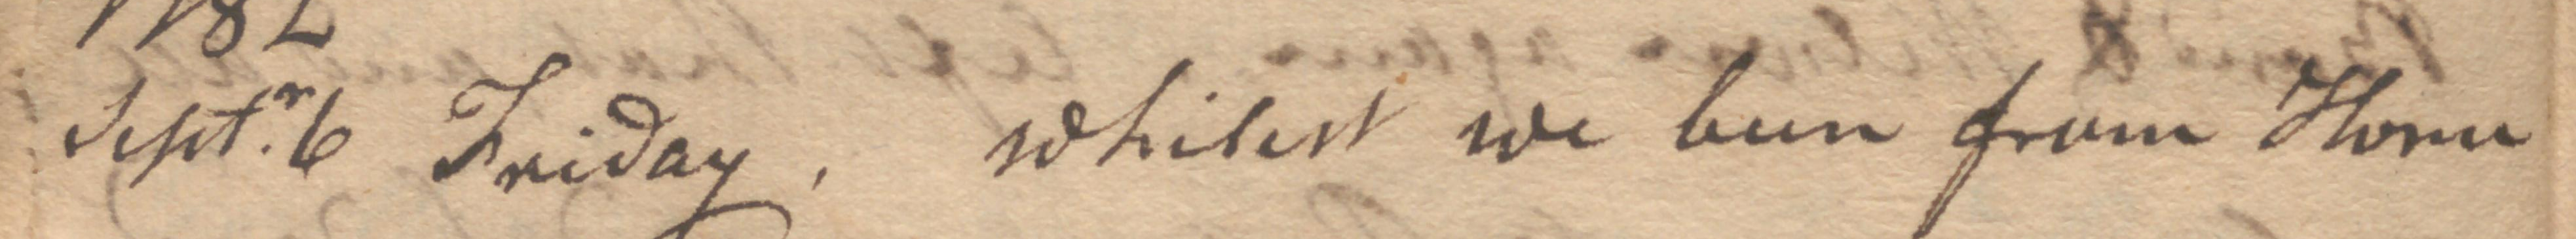Sept^r. 6 Friday, whilest we been from Home
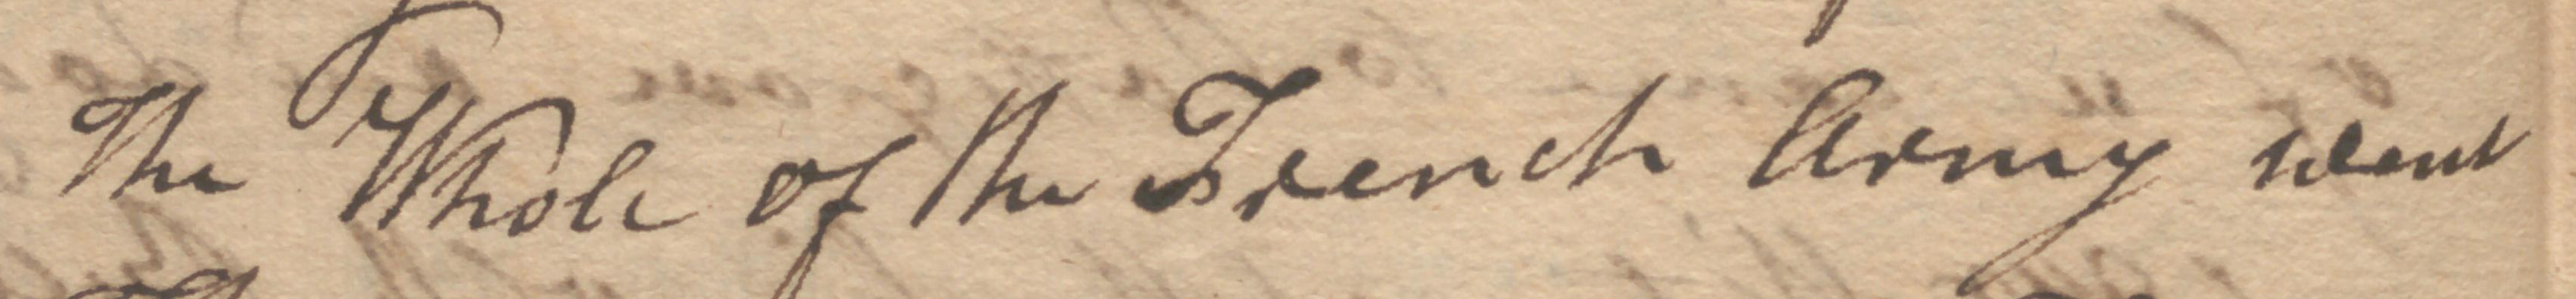The Whole of the French Army went
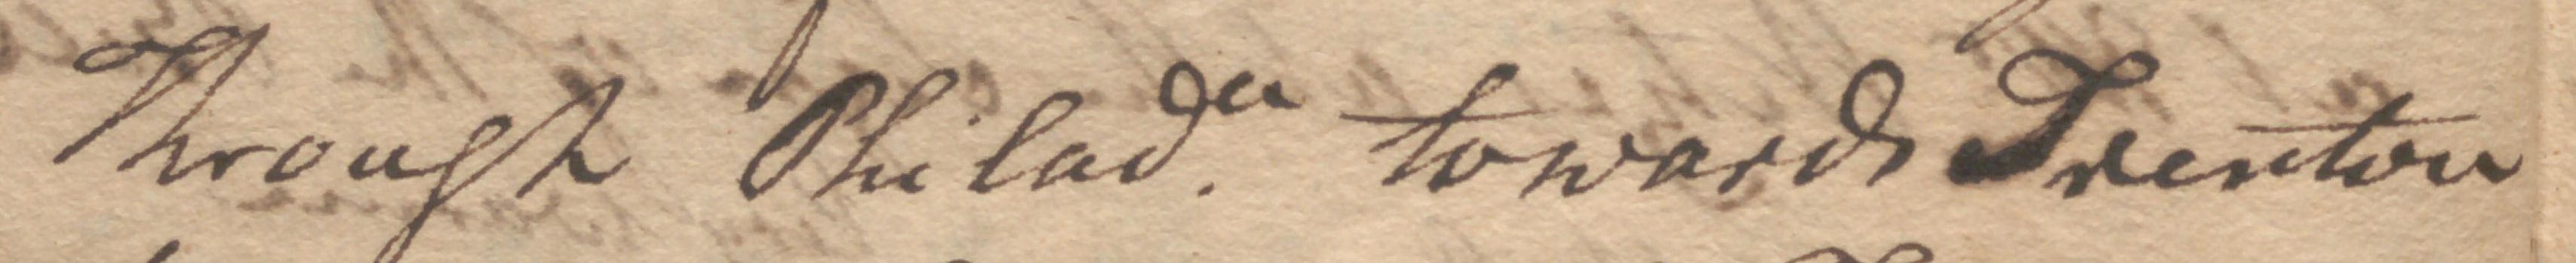Through Philad^a. towards Trenton
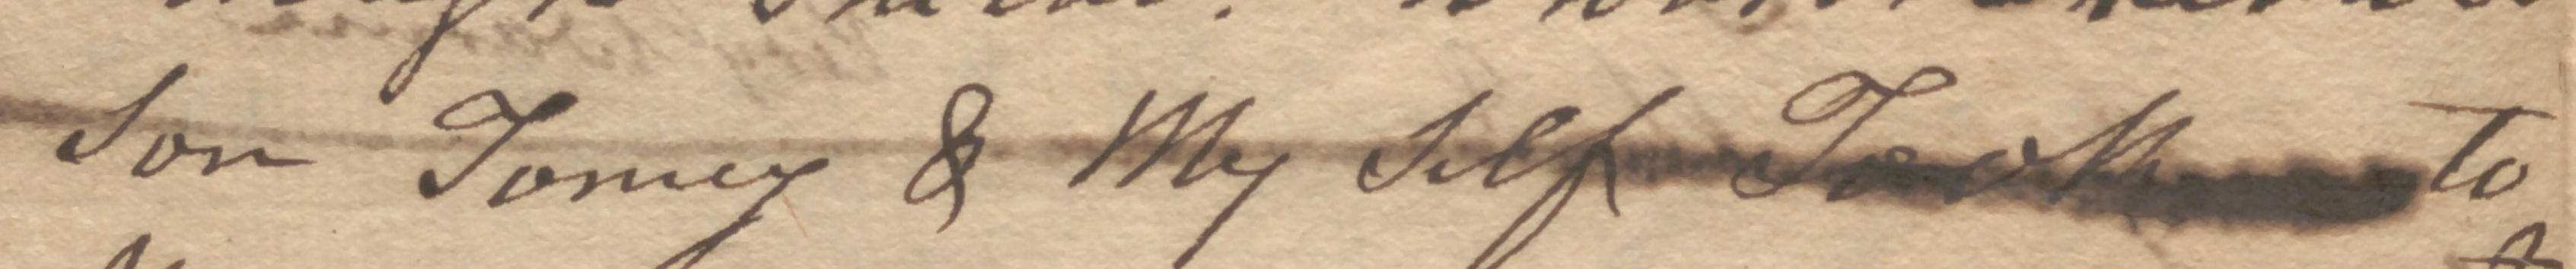Son Tomey & My selfe Took to
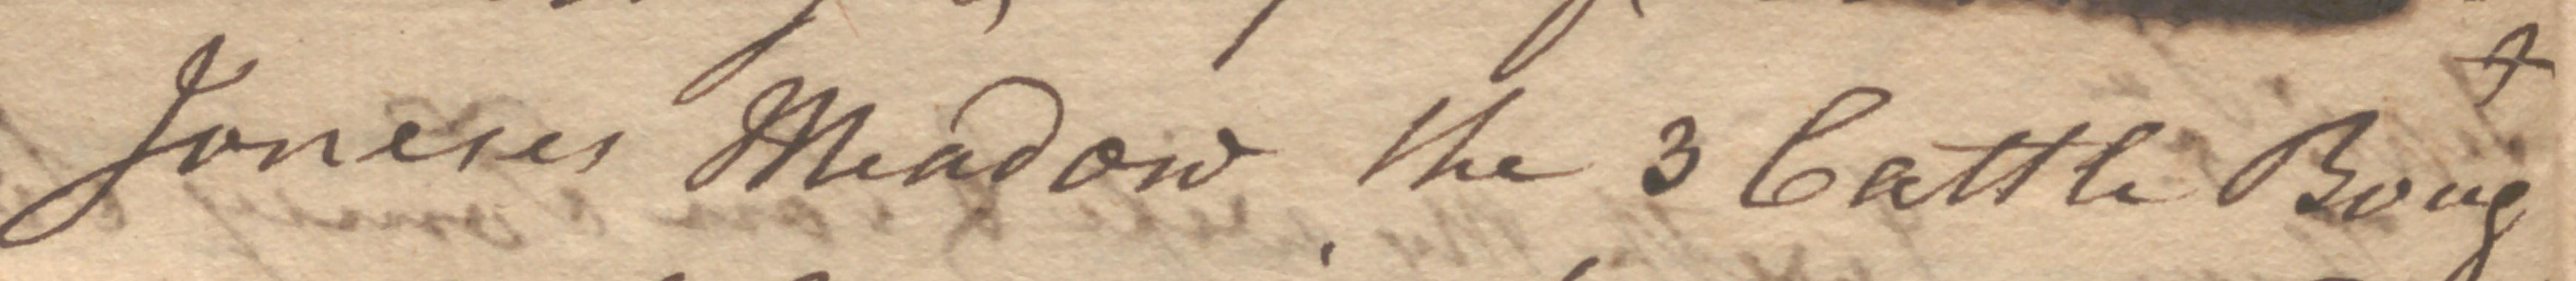Joneses Meadow the 3 Cattle Boug^t
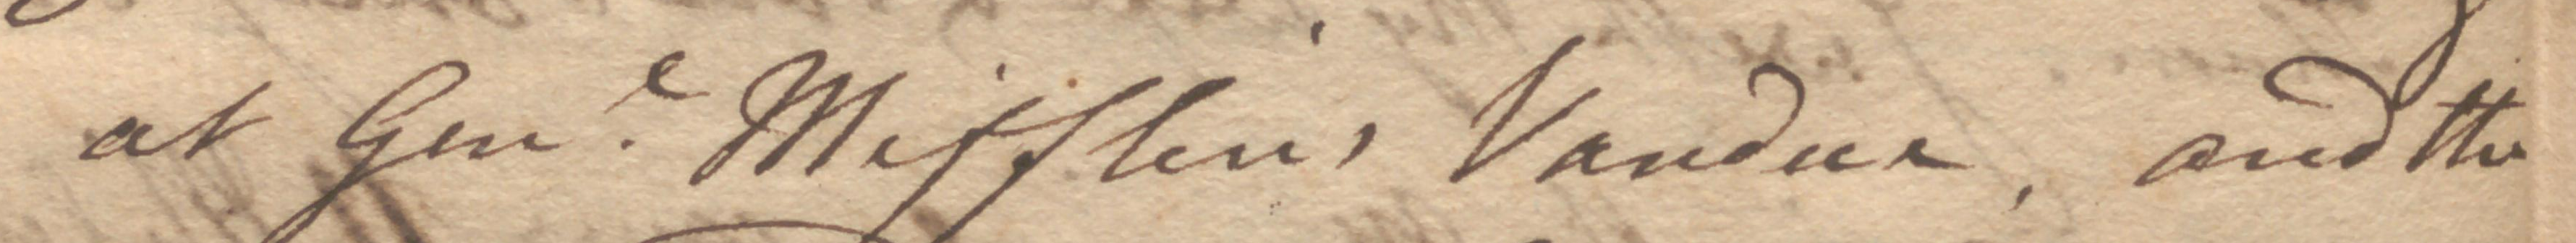at Gen^l. Mifftens Vandue, and the
